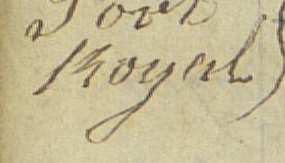Royal
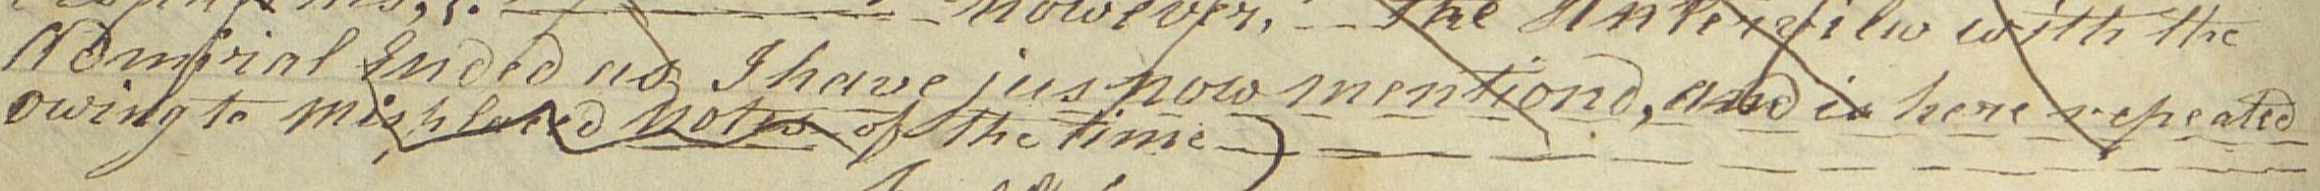Admiral Ended us, I have jus now mentiond, and is here repeated
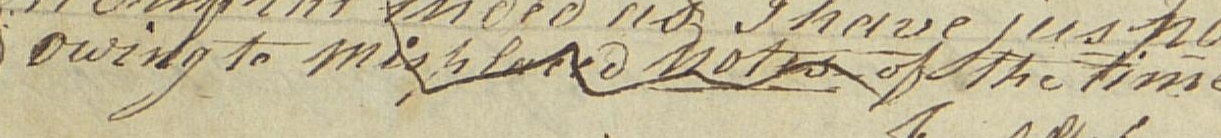owing to misplaced notes of the time
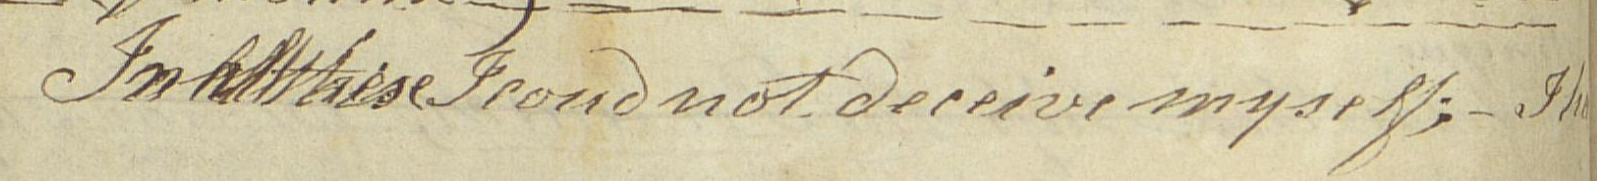In all these I coud not deceive myself; I h-
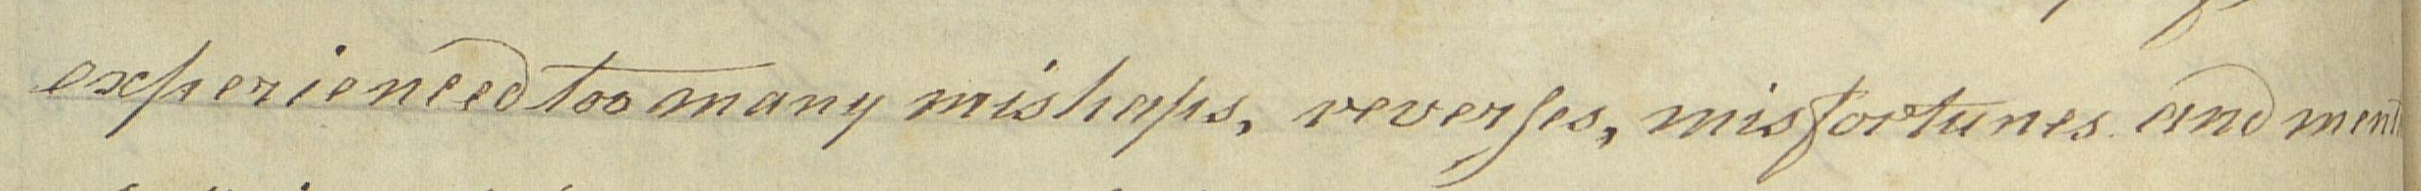experienced too many mishaps, reverses, misfortunes and ment-
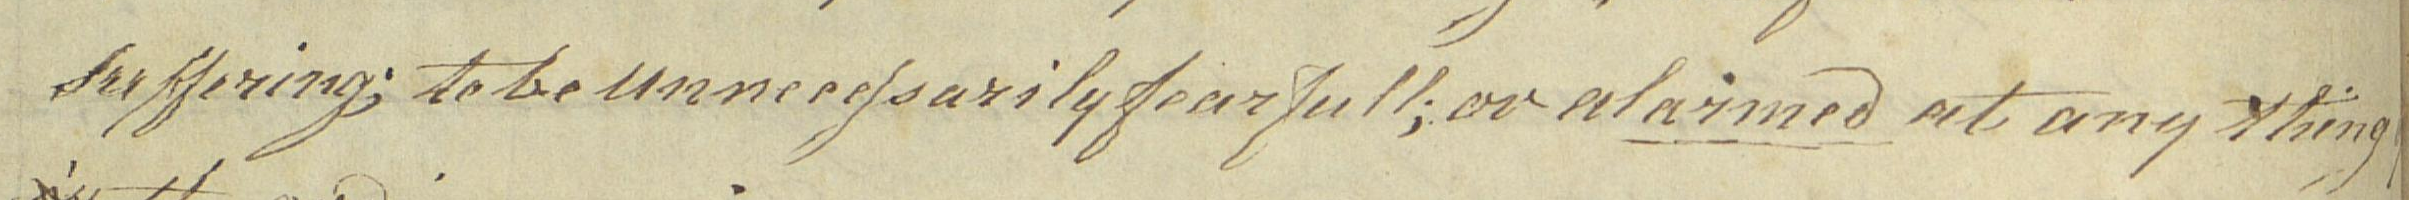suffering to be unnecessarily fearfull; or alarmed at any thing
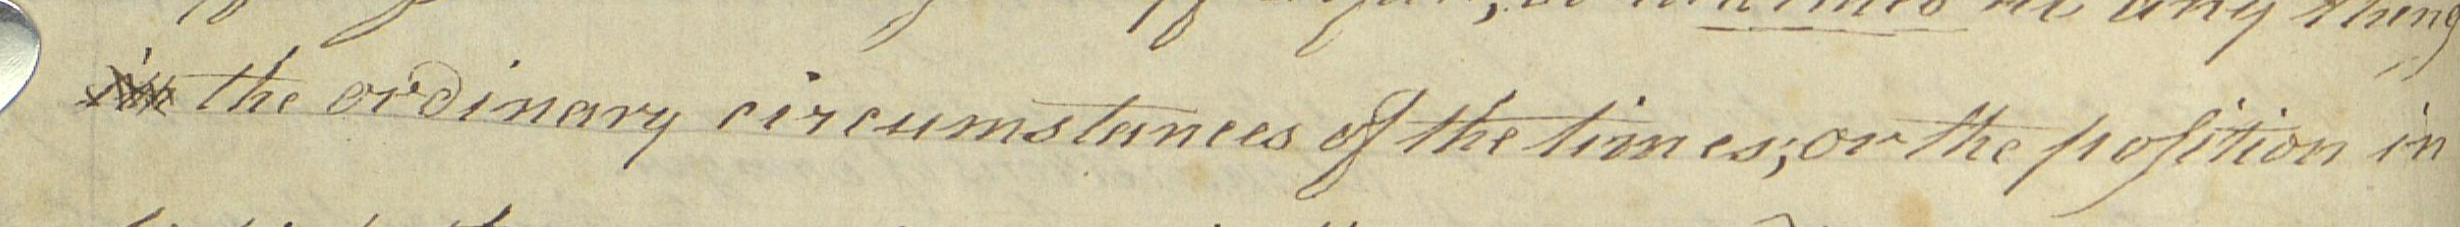it the ordinary circumstances of the times; or the position in
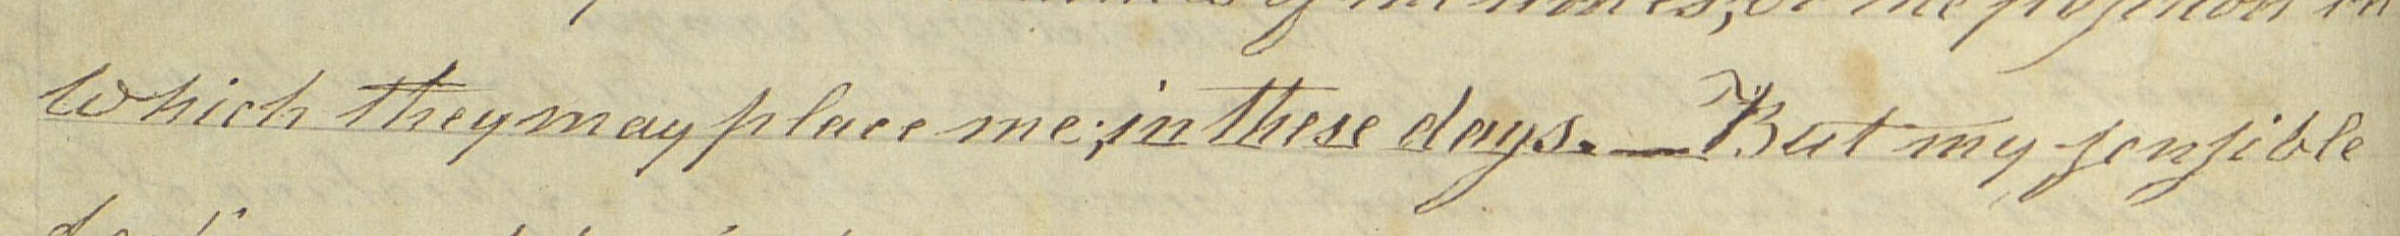which they may place me; in these days. But my sensible
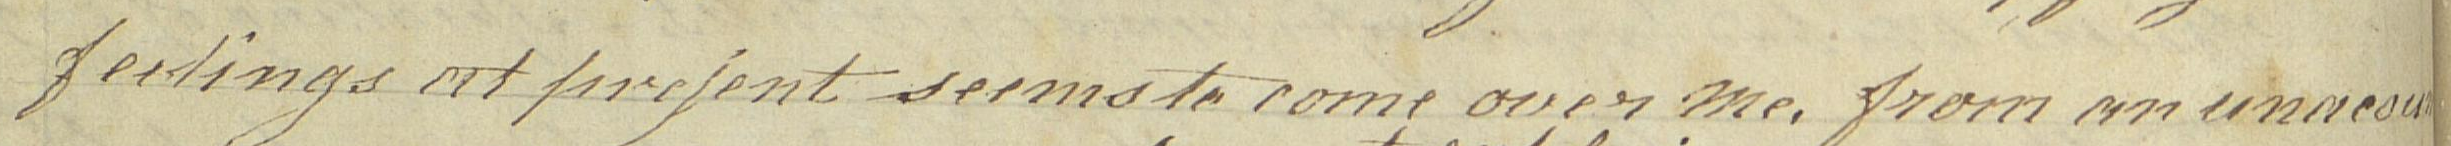feelings at present seems to come over me from an unacou-
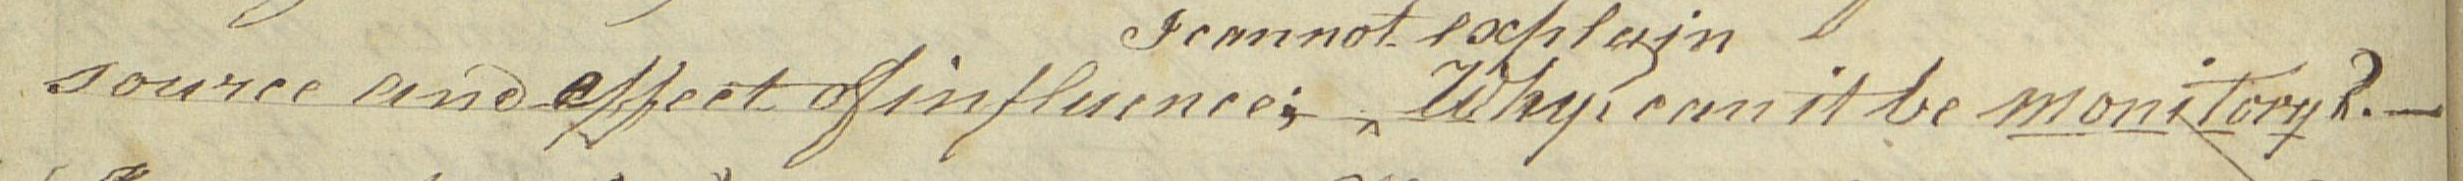source and effect of influence; ^ Why can it be monitory?
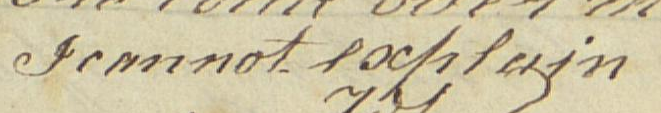I cannot explain
